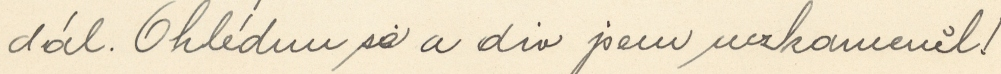dál. Ohlédnu se a div jsem nezkameněl!
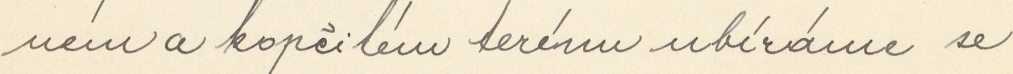ném a kopčitém terénu ubíráme se
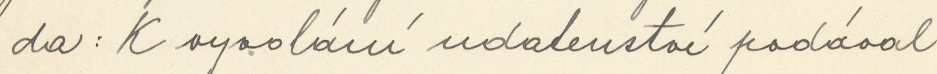da: K vyvolání udatenství podával
